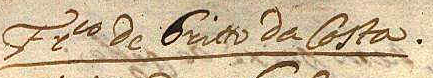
Frco de britto da Costa.
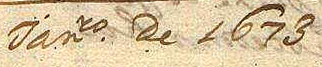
Ian.ro de 1673
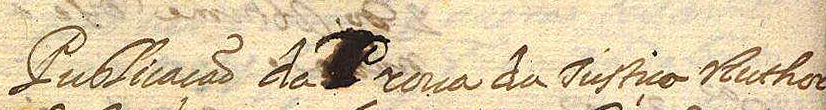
Publicação da Proua da Iustiça Author
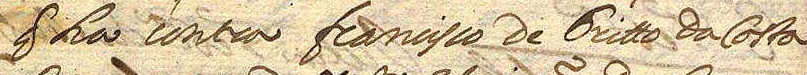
q̄ ha contra francisco de britto da Costa
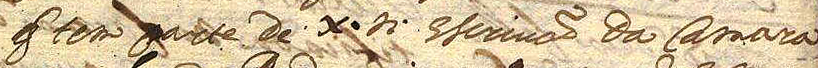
q̄ tem parte de x. n. Escriuaõ da Camara
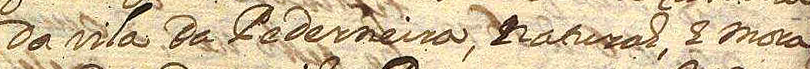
da vila da Pederneira, natural, E mora
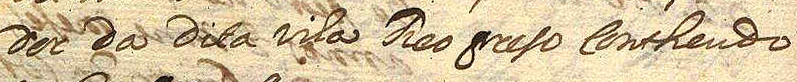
dor da dita vila Reo preso contheudo
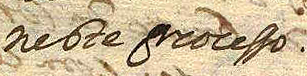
neste processo.
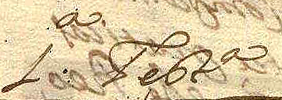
1.a Testa
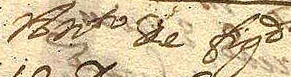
Anto de figdo
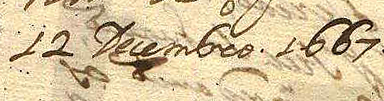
12 Decembro 1667
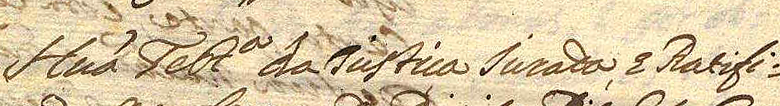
Huā Testa da Iustiça Iurada, E Ratifi
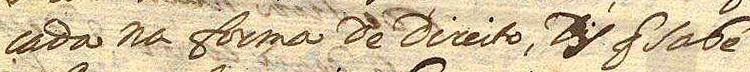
cada na forma de Direito, Dis q̄ sabe
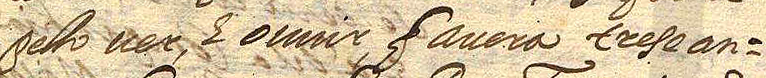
pello uer, e ouuir q̄ auera trese an
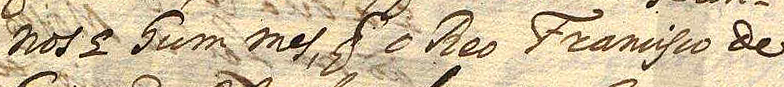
nos E hum mes, q̄ o Reo Francisco de
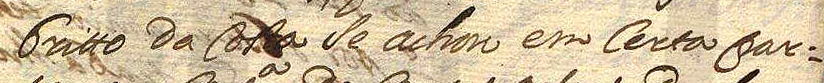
britto da costa se achou em Certa par
